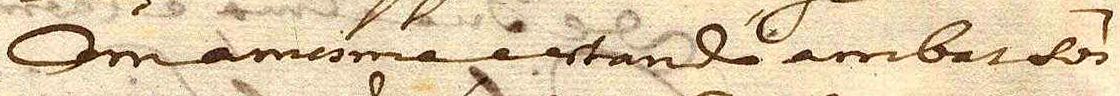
Com a mesma e estando ambas sós
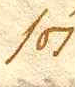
sos
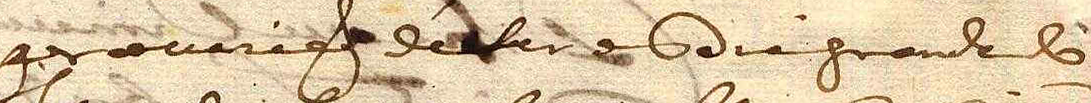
por occaziaõ de ser o Dia grande do
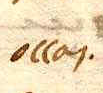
occas.
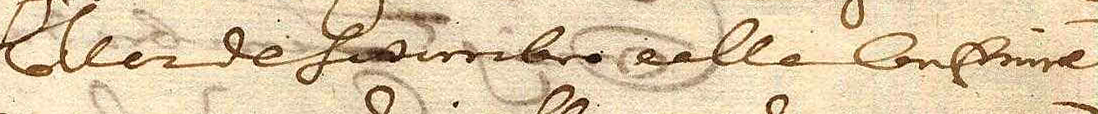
Mes de setembro e ella Confitente
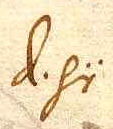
d. gr
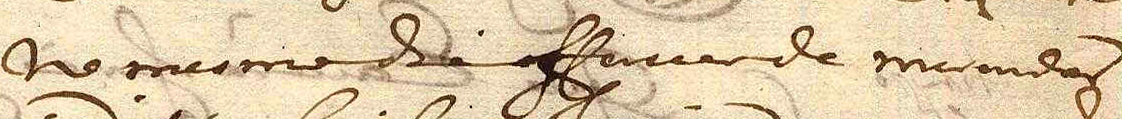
no mesmo dia offerecer de merendar
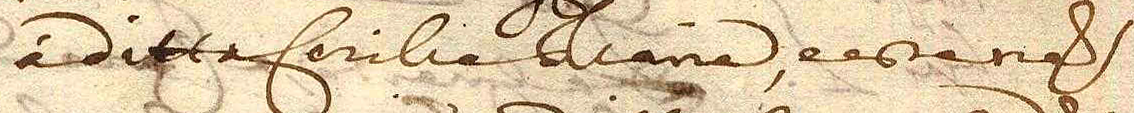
á ditta Cezilia Maria, e esta naõ
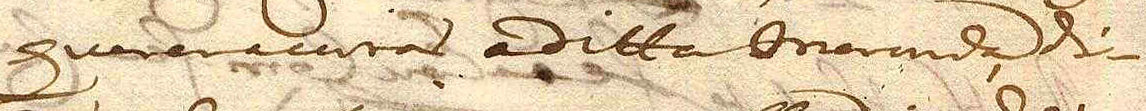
querer aceitar a ditta merenda, di
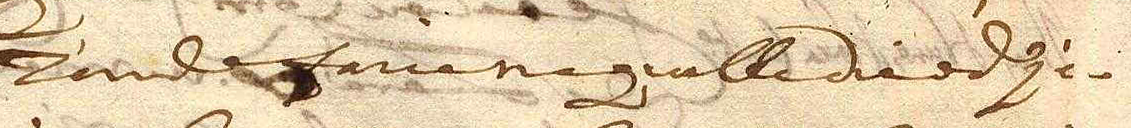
zendo fazia naquelle dia o do je
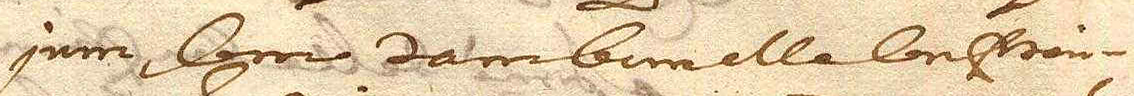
jum, Como tambem ella Confiten
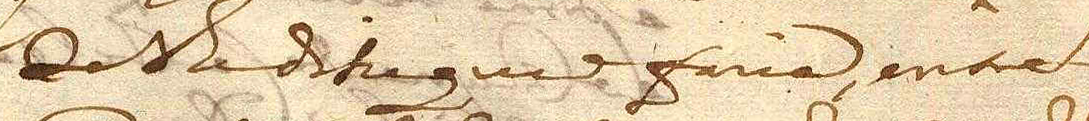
te lhe disse que fazia entre
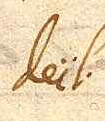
decl.
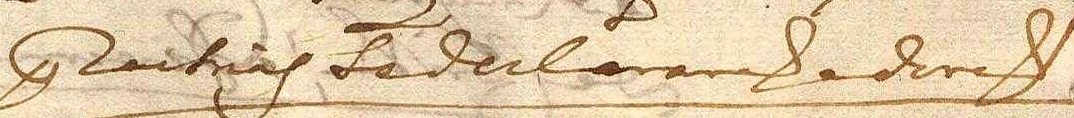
practicas se declararaõ e deraõ
